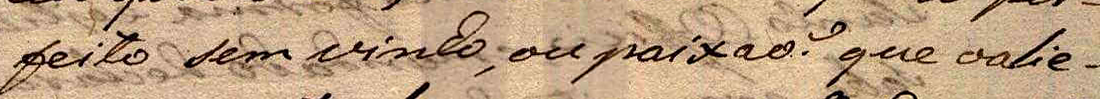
feito sem vinho, ou paixaõ que o alie
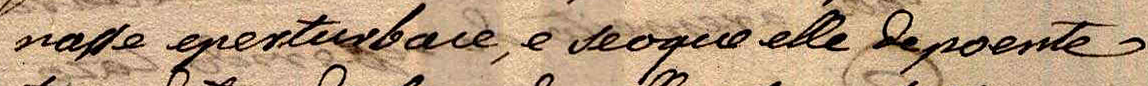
nasse e perturbace, e se o que elle depoente
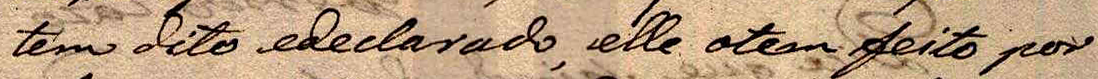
tem dito e declarado, elle o tem feito por
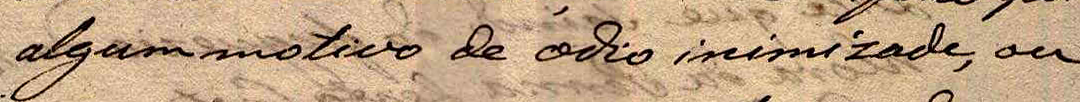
algum motivo de odio inimizade, ou
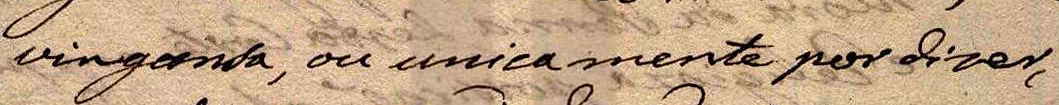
vingansa, ou unicamente por dizer,
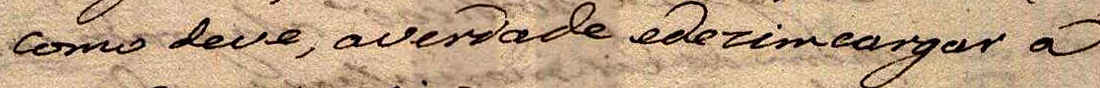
como deve, a verdade e dezimcargar a
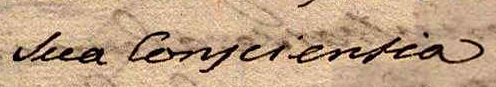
sua consciensia
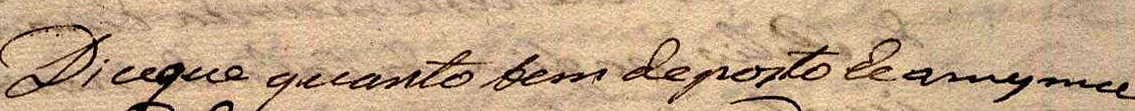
Dice que quanto tem deposto he a mesma
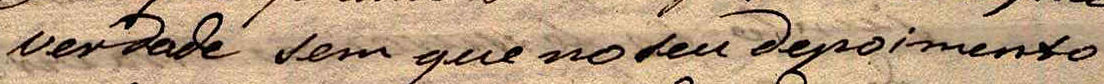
verdade sem que no seu depoimento
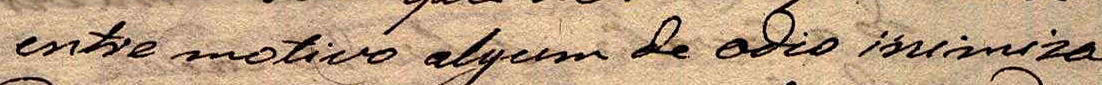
entre motivo algum de odio inimiza
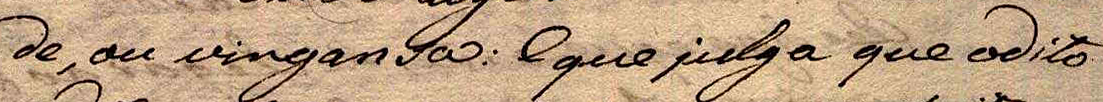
de, ou vingansa: E que julga que o dito
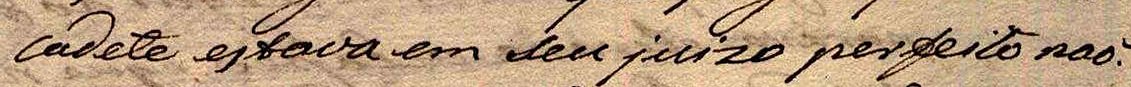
cadete estava em seu juizo perfeito naõ
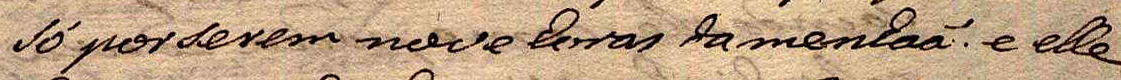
só por serem nove horas da menhaã e elle
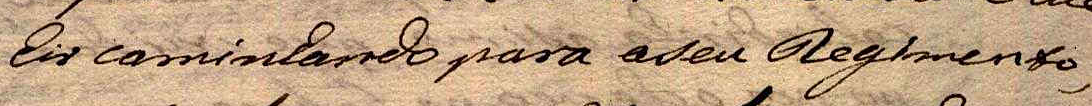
hir caminhando para a seu Regimento,
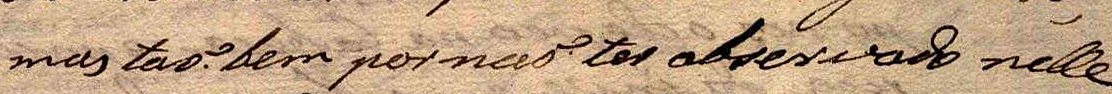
mas taõbem por naõ ter observado nelle
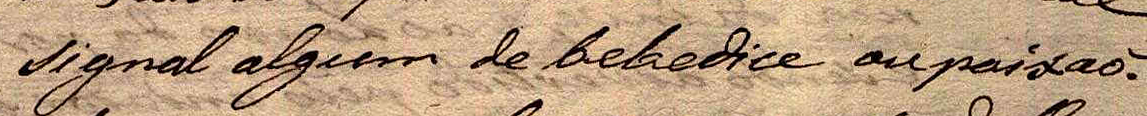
signal algum de bebedice ou paixaõ
